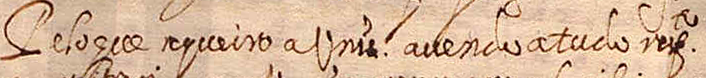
Pelo que requeiro a V ms̄. auendo a tudo resp.to
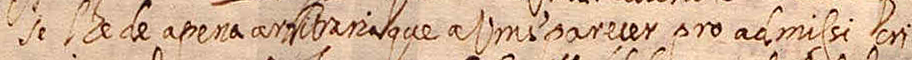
se lhe de a pena arbitraria que a V ms̄. parecer pro admissi cri
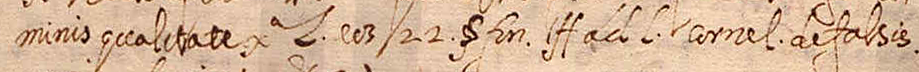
minis qualitate xa L. eos 22. § fin ff ad l. cornel. de falsis
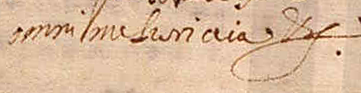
omni meliori aia &ꝭ.
